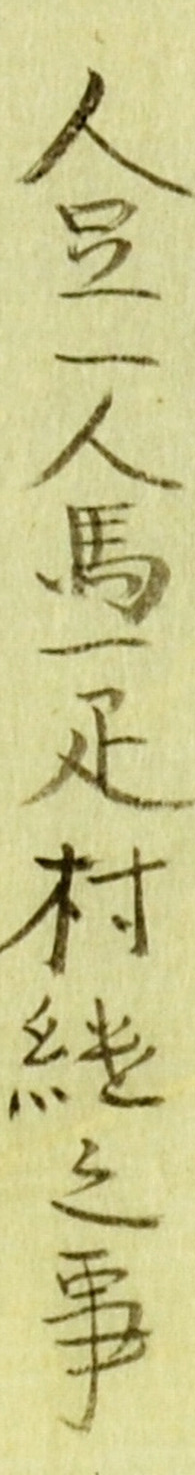人足一人馬一疋村継之事

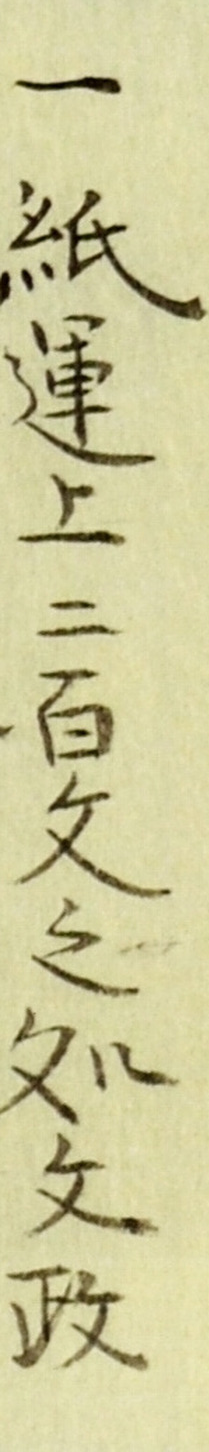一紙運上二百文之処文政
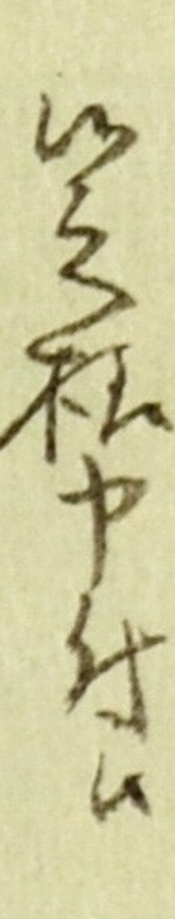候之様申付候
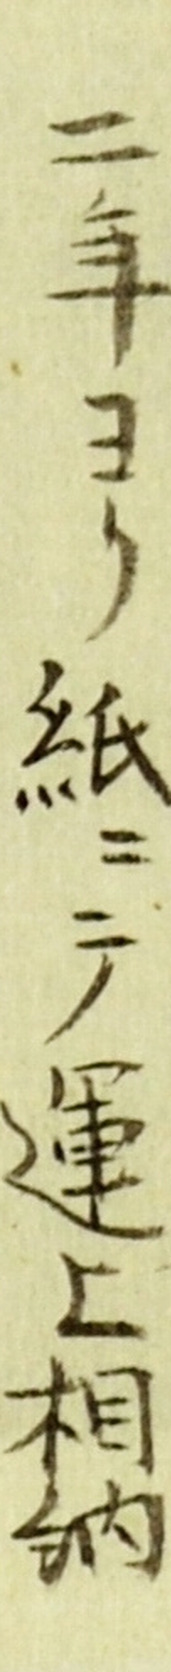二年ヨリ紙ニテ運上相納
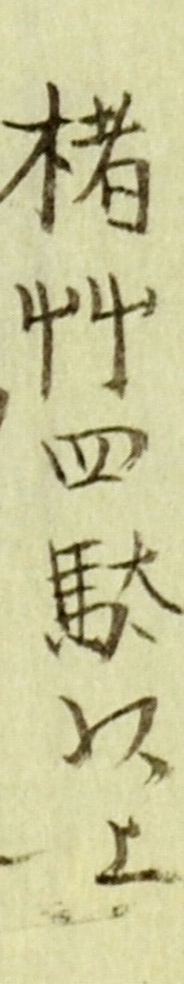楮草四駄以上
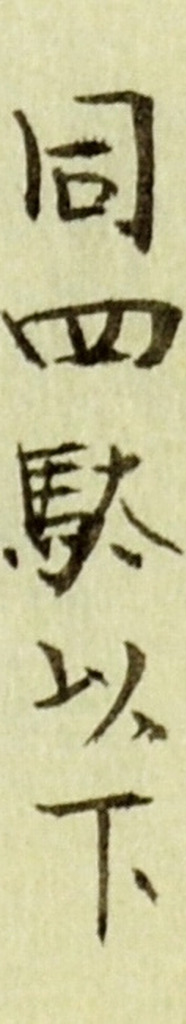同四駄以下
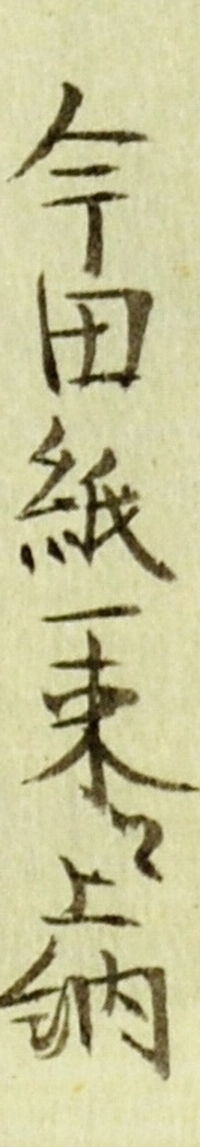今田紙一束ツヽ上納
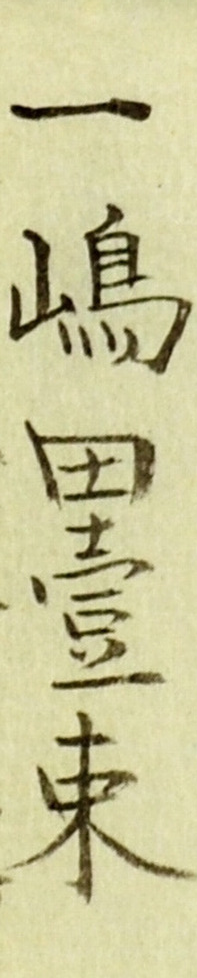一嶋田壹束
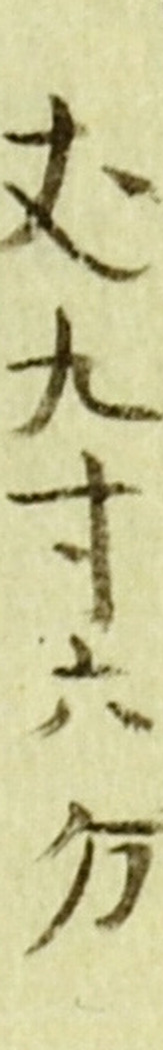丈九寸六分
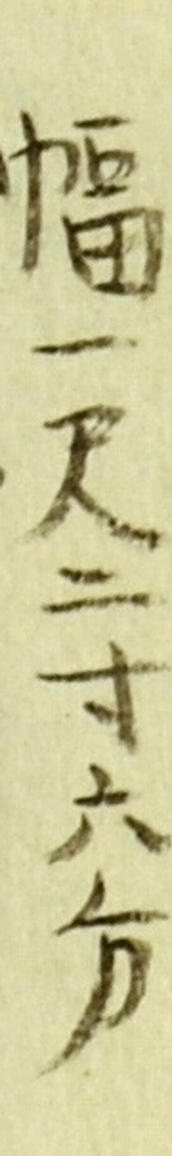幅一尺二寸六分
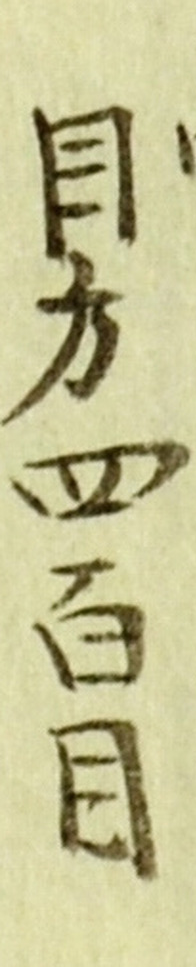目方四百目
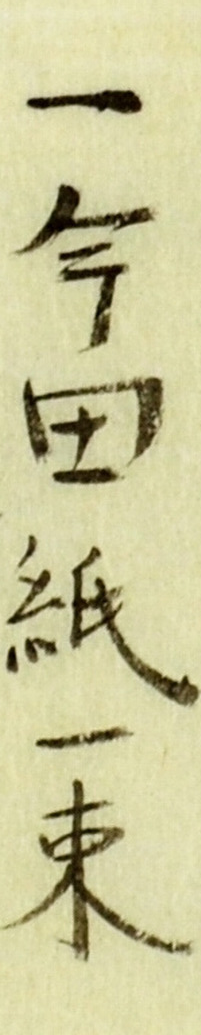一今田紙一束
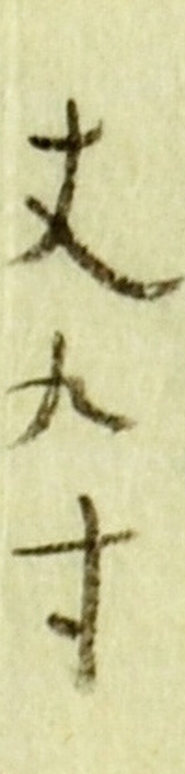丈九寸
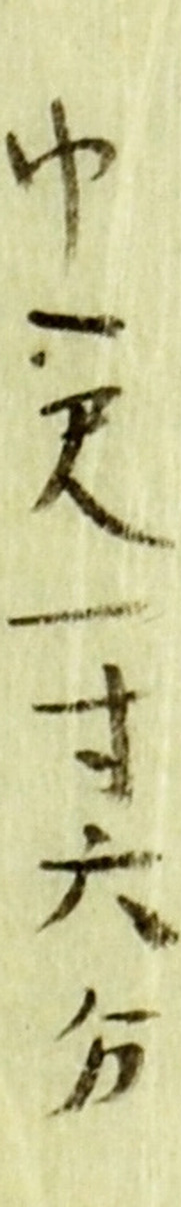巾一尺一寸六分
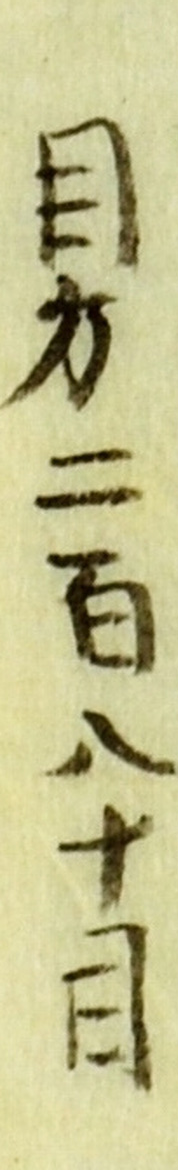目方二百八十目
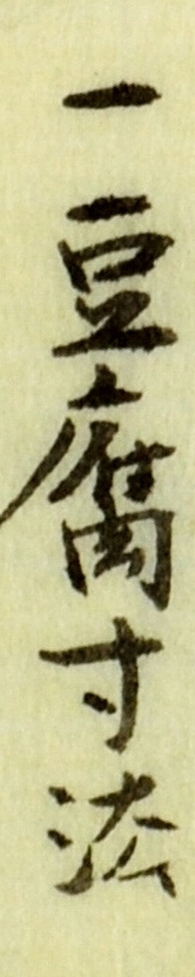一豆腐寸法
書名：分一御定法
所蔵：伊那市立高遠町図書館・合同会社AMANE
